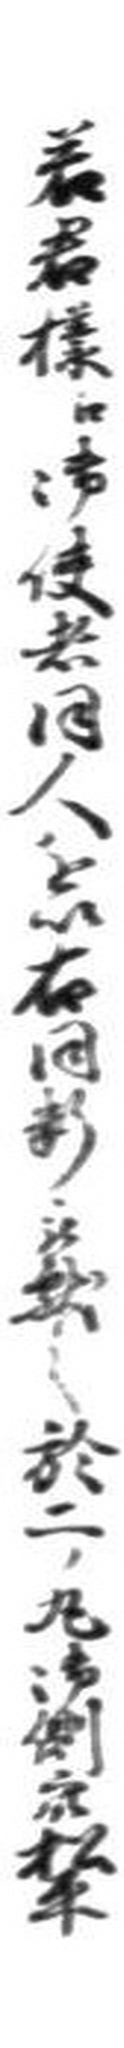若君様江御使者同人を以右同断被献之於二ノ丸御側衆松平
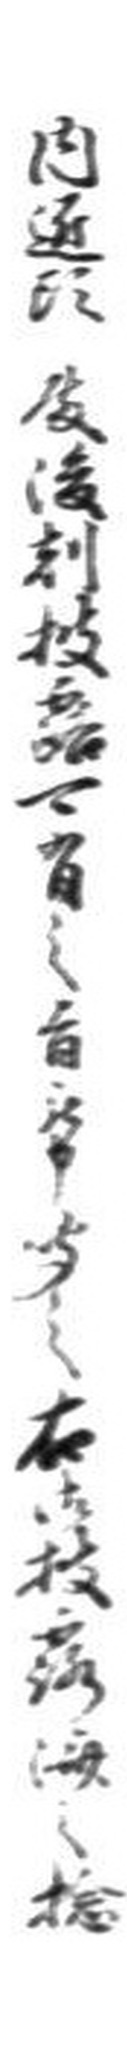内匠頭殿後刻披露可有之旨被申聞之右御披露済之捻
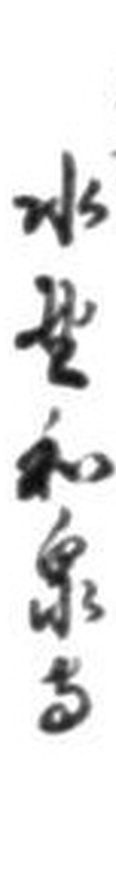水野和泉守

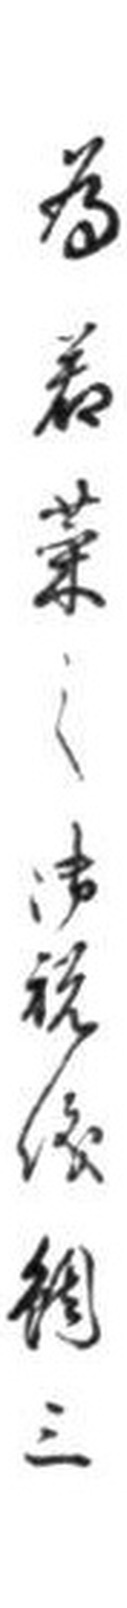為若菜之御祝儀鯛三
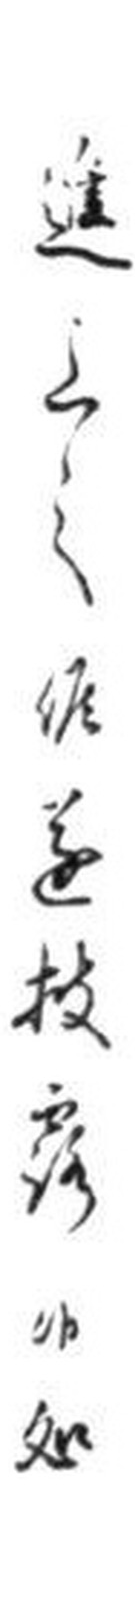進上之候遂披露候処
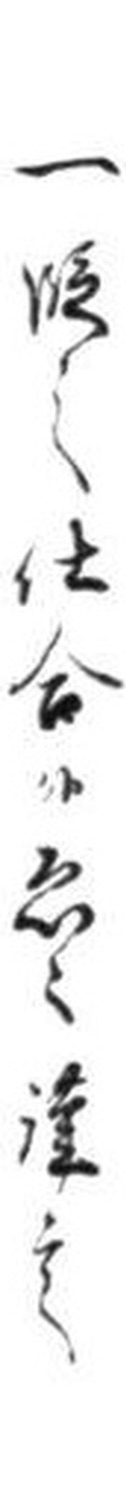一段之仕合候恐々謹言
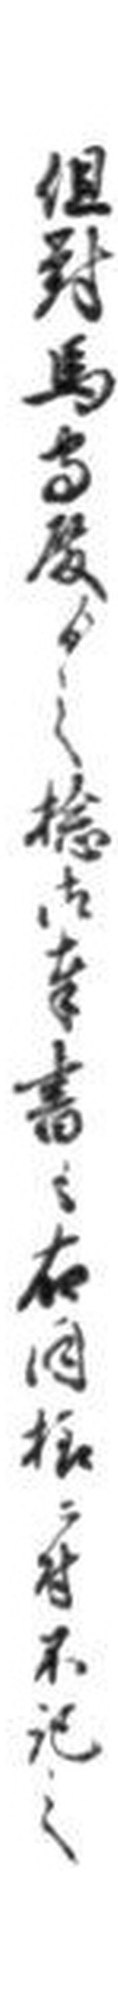但対馬守殿ゟ之捻御奉書も右同様ニ付不記之
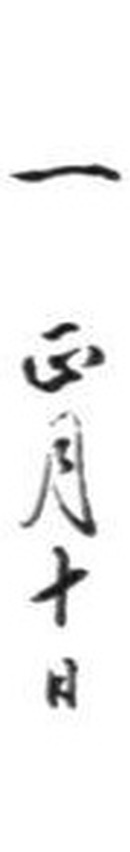一正月十日
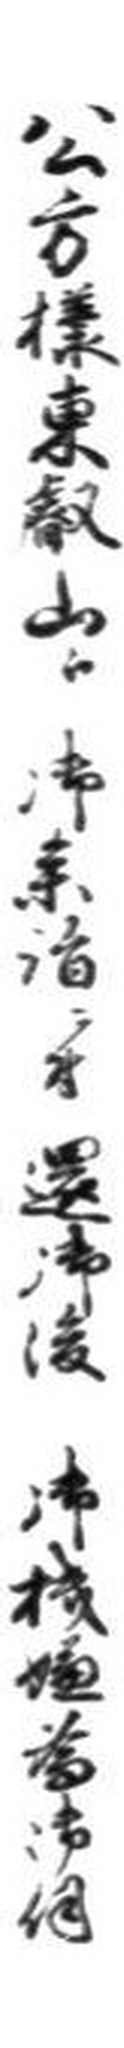公方様東叡山江御参詣ニ付還御後御機嫌為御伺
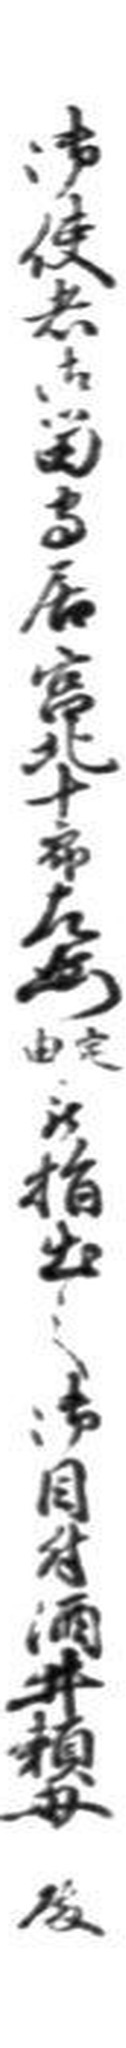御使者御留守居宮北十郎左衛門定由被指出之御目付酒井頼母殿
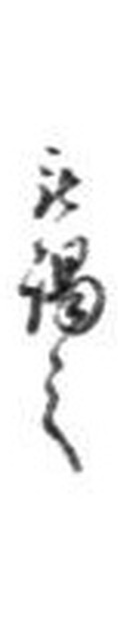被謁之
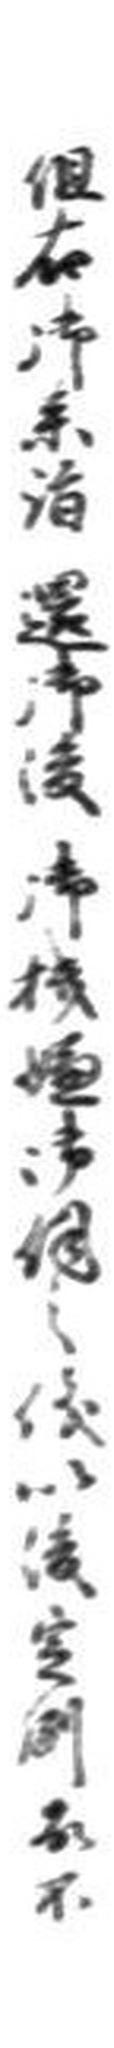但右御参詣還御後御機嫌御伺之儀以後定例故不
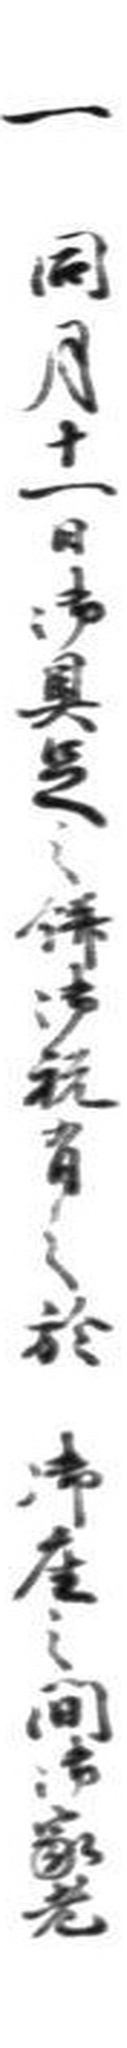一同月十一日御具足之餅御祝有之於御座之間御家老
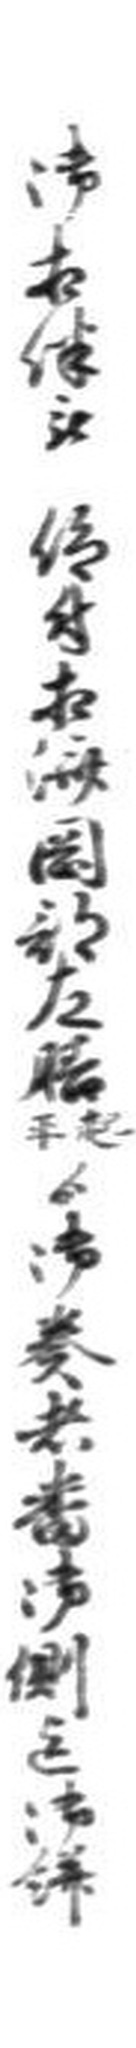御相伴被仰付相済岡部左膳起平ゟ御奏者番御側迄御餅
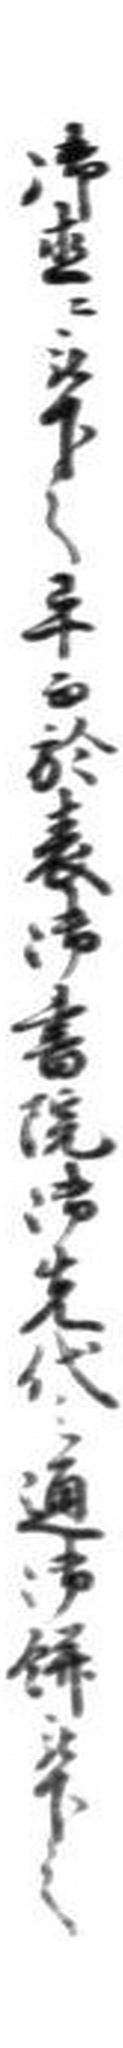御直ニ被下之畢而於表御書院御先代之通御餅被下之
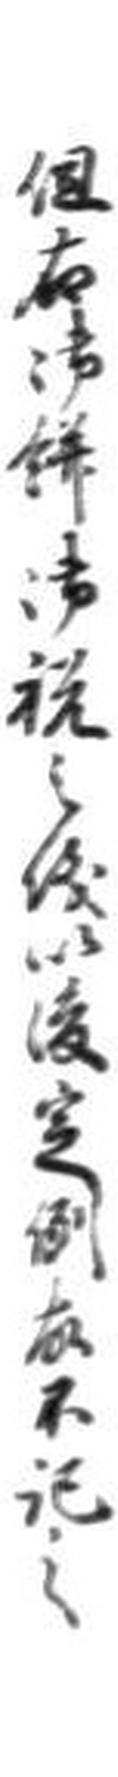但右御餅御祝之儀以後定例故不記之
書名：家譜 三十九 宗矩公 享保十年
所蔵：福井県文書館 Fukui Prefectural Archives
